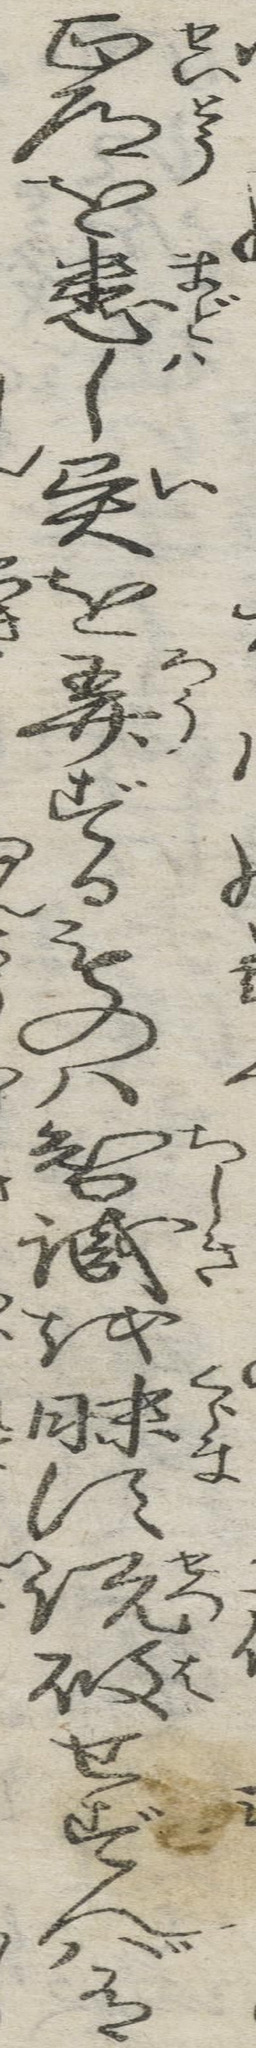正道を惑し異を弄ずるものは智識を昧す説破せずんば有
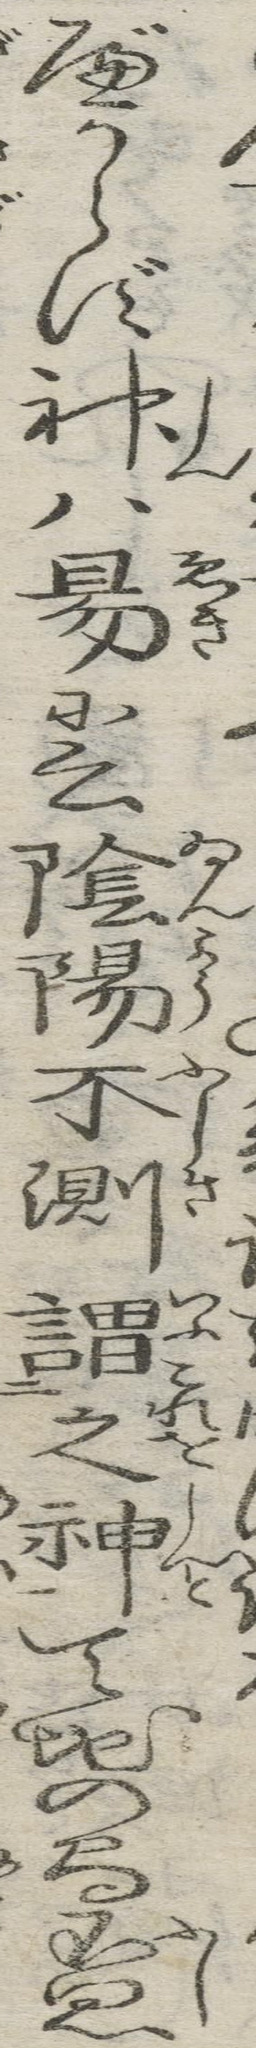べからず神は易に云陰陽不側謂之神天地の間不思
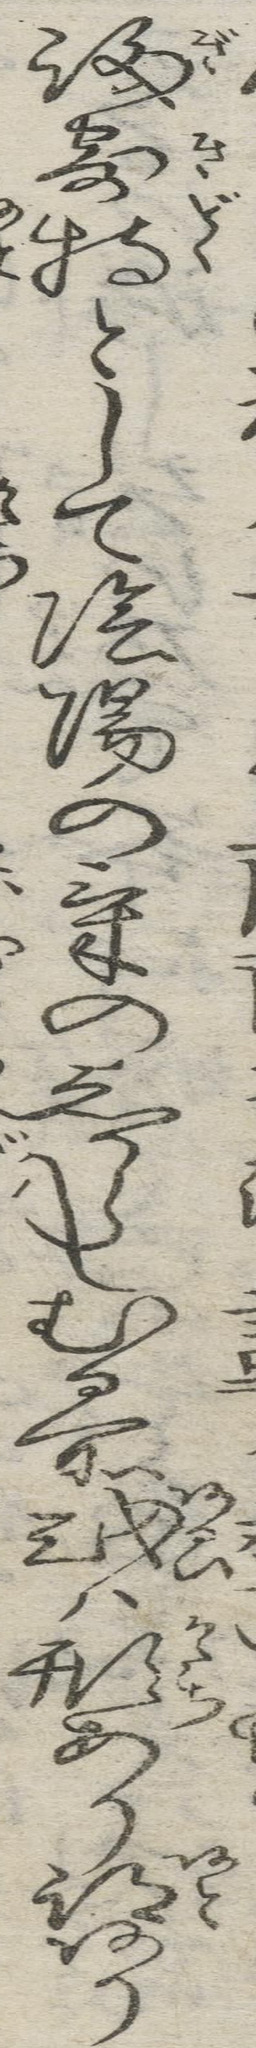議奇特として陰陽の気のしらしむる所或は形あり跡あり
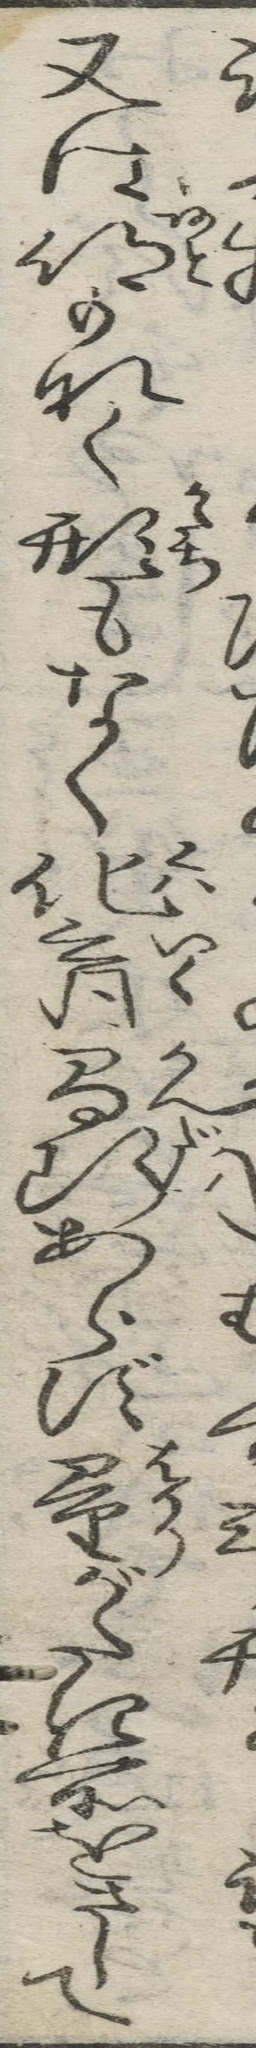又は跡のなく形もなく化育間断あらず量がたき所をさして
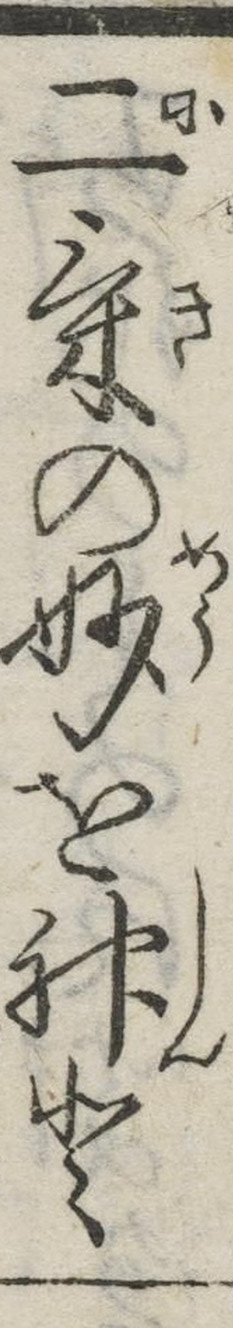二気の妙を神登
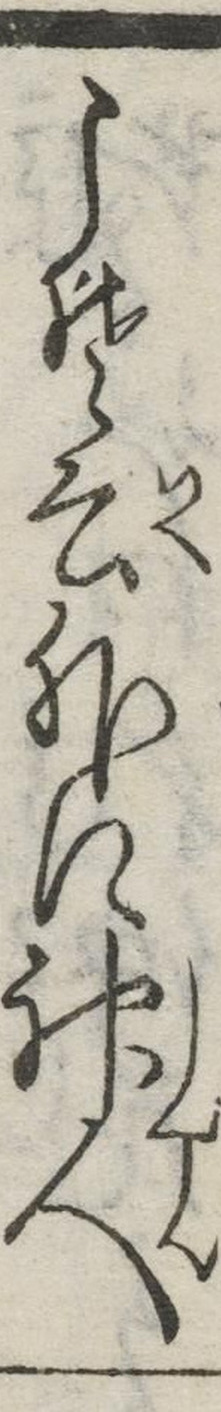り神上云外に神人
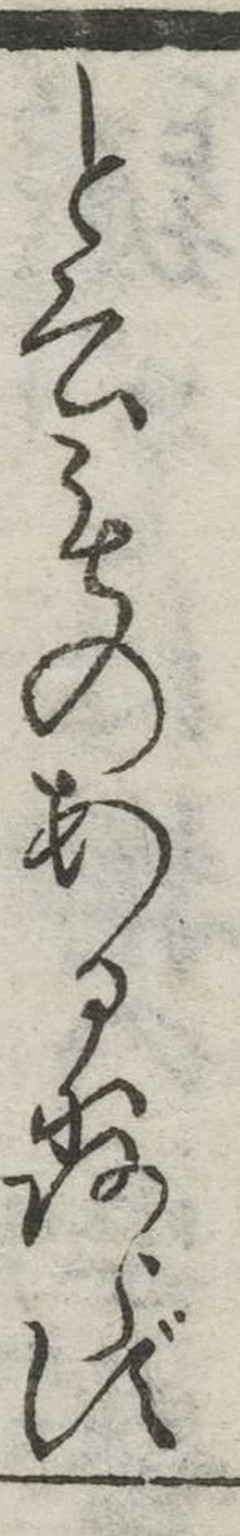と云ものあるにあらず
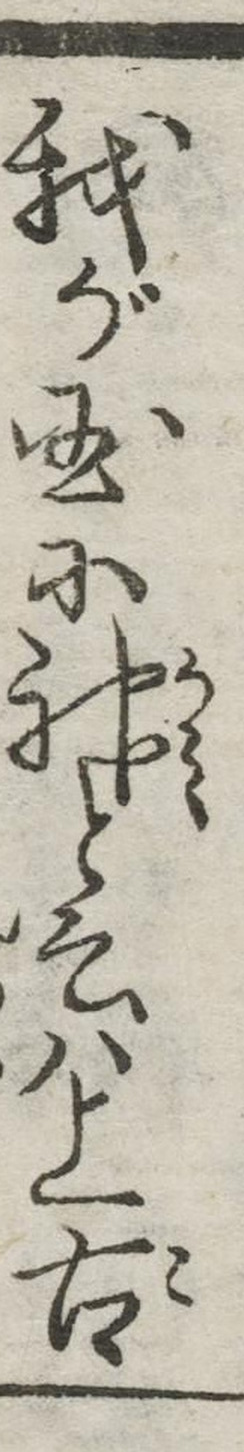我が国に神と云は上古
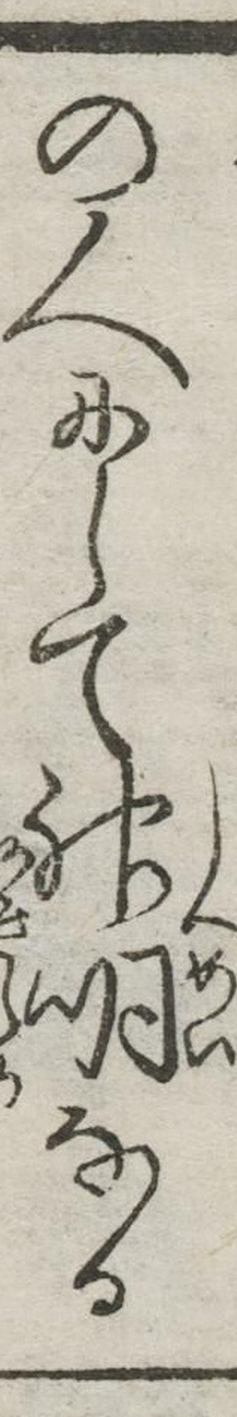の人にして神明なる
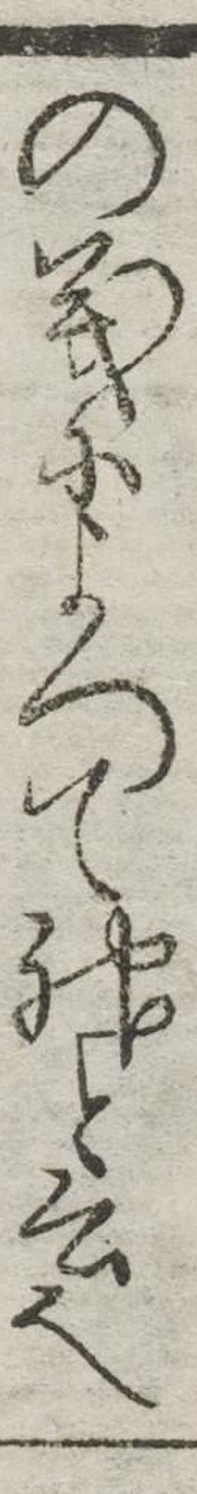の義によつて神と云也
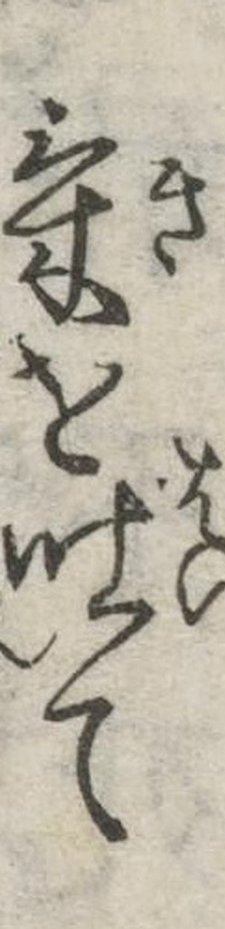気を吐て
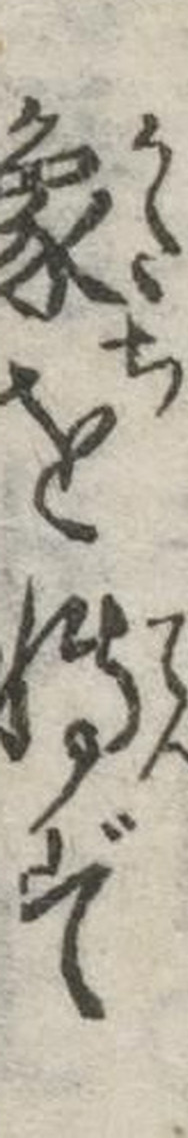象を傳ず
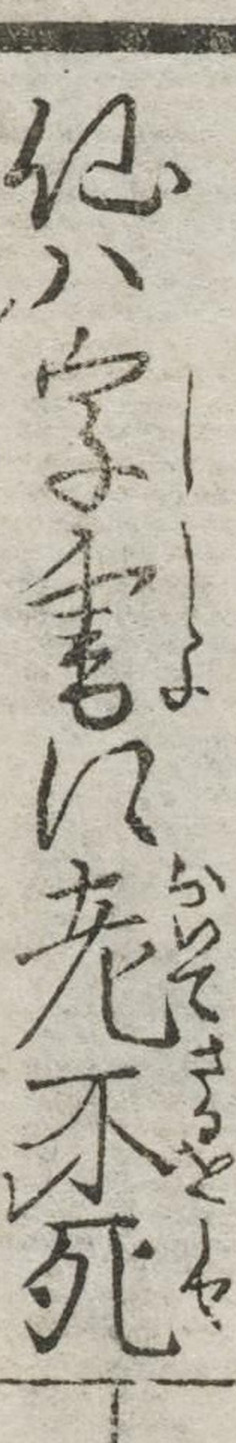仙は字書に老不死
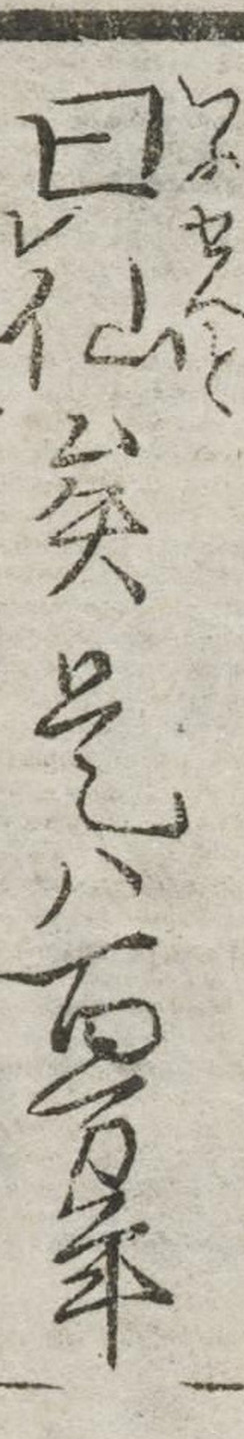曰仙矣是は百万年
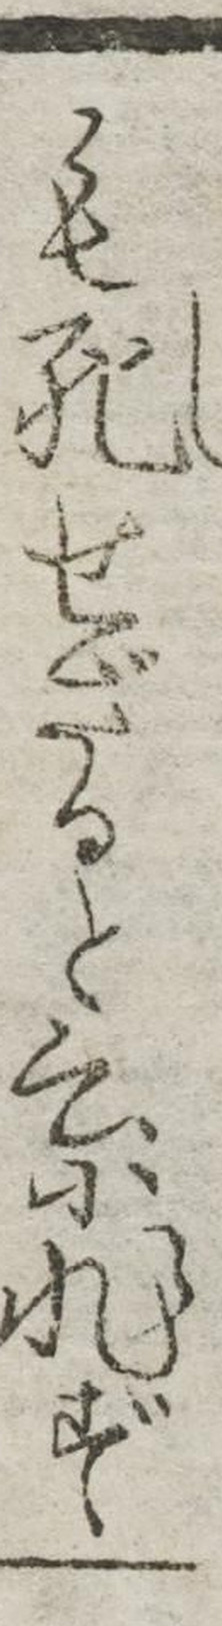も死せざると云に非ず
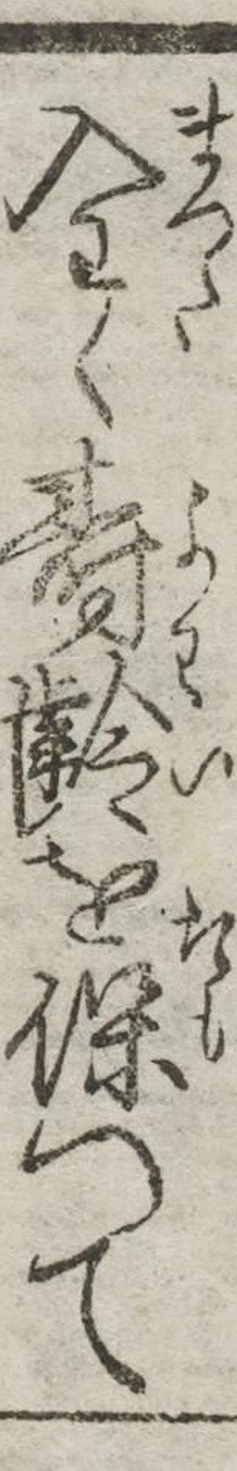全く壽齢を保つて
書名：訓蒙天地辨　人
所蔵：東京大学地震研究所図書室 Earthquake Research Institute Library, The University of Tokyo, JAPAN
